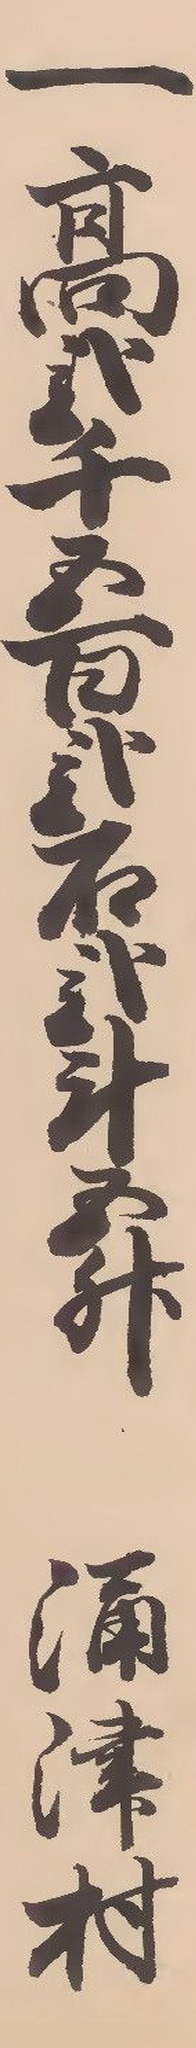一高弐千五百弐石弐斗五升涌津村
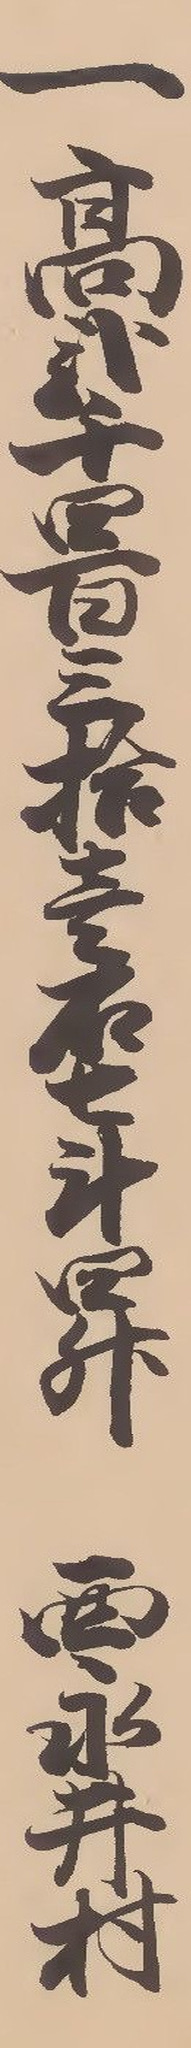一高弐千四百三拾壱石七斗四升西永井村
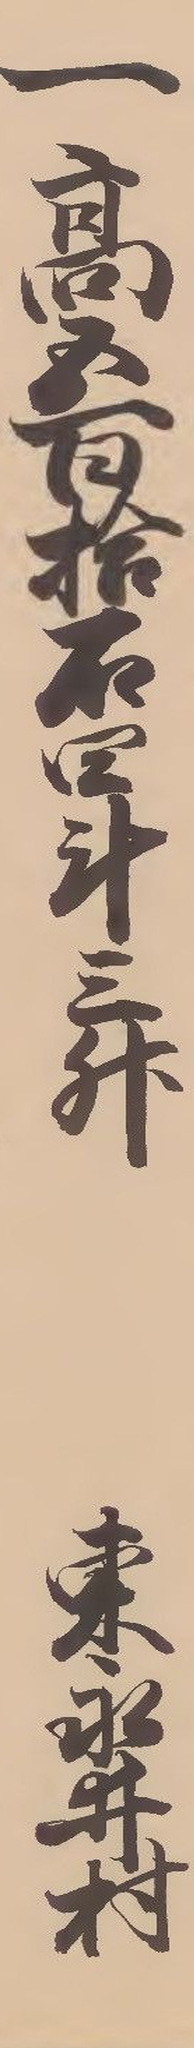一高五百拾石四斗三升東永井村
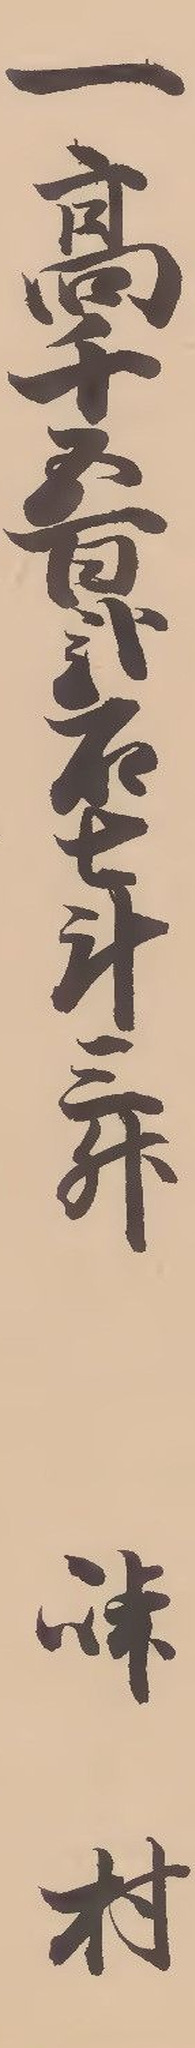一高千五百弐石七斗三升峠村
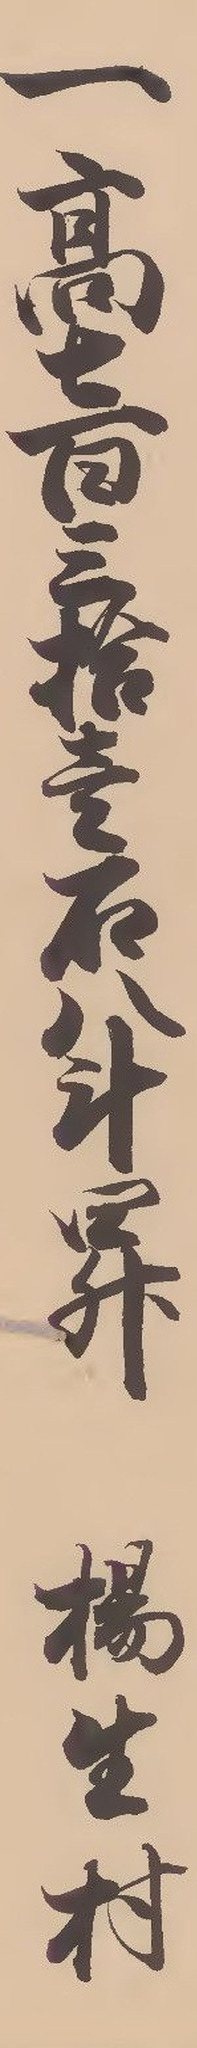一高七百三拾壱石八斗四升揚生村

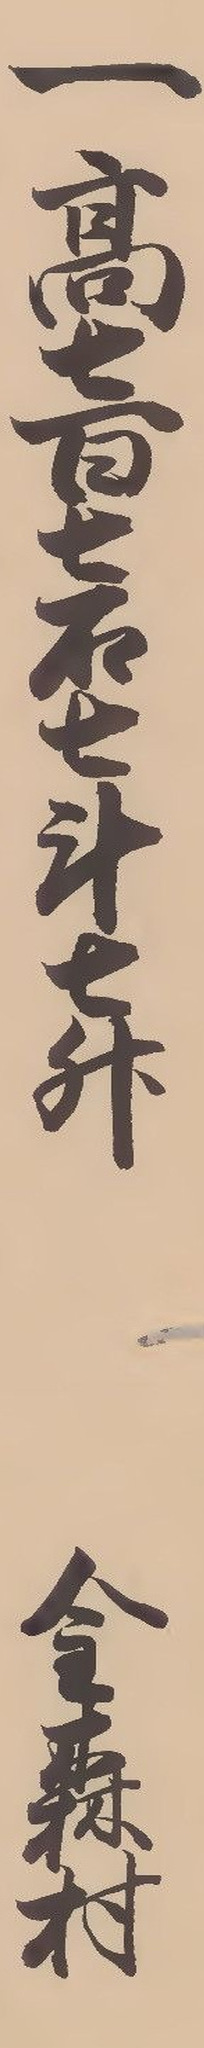一高七百七石七斗七升金森村
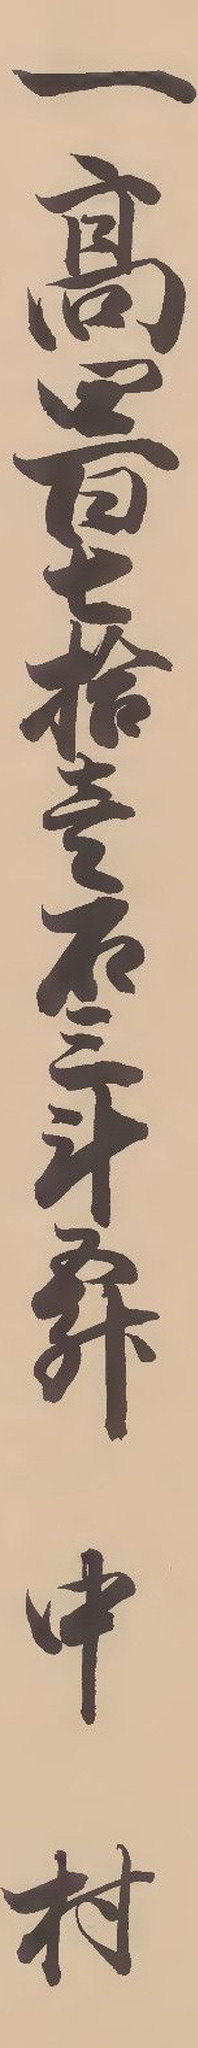一高四百七拾壱石三斗五升中村
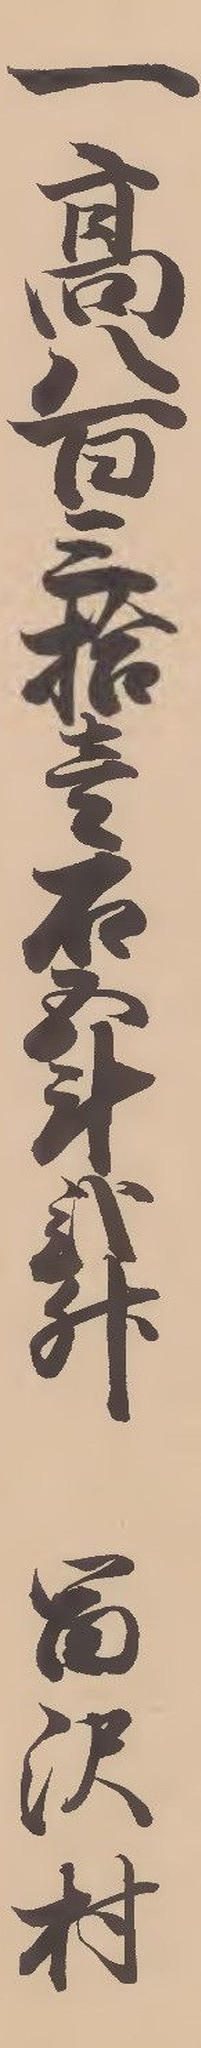一高八百三拾壱石五斗弐升富沢村
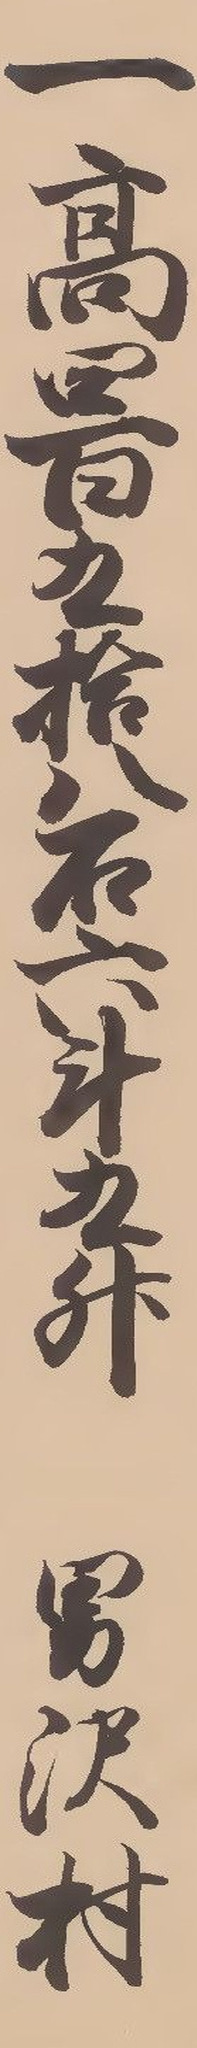一高四百九拾八石六斗九升男沢村
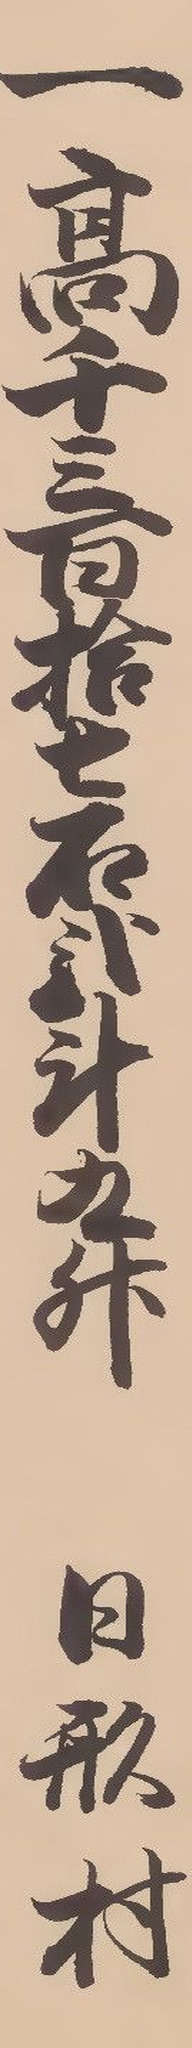一高千三百拾七石弐斗九升日形村
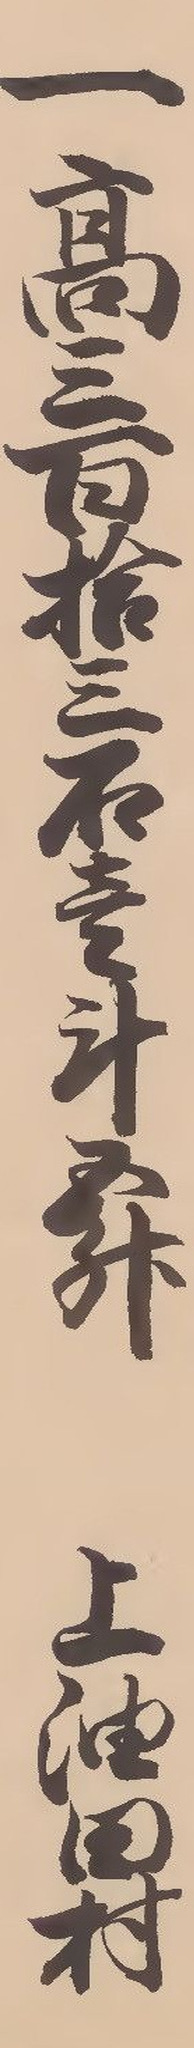一高三百拾三石壱斗五升上油田村
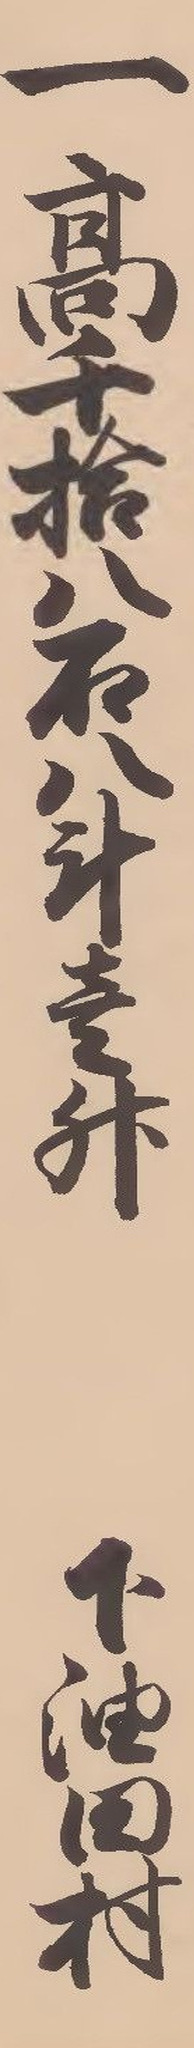一高千拾八石八斗壱升下油田村
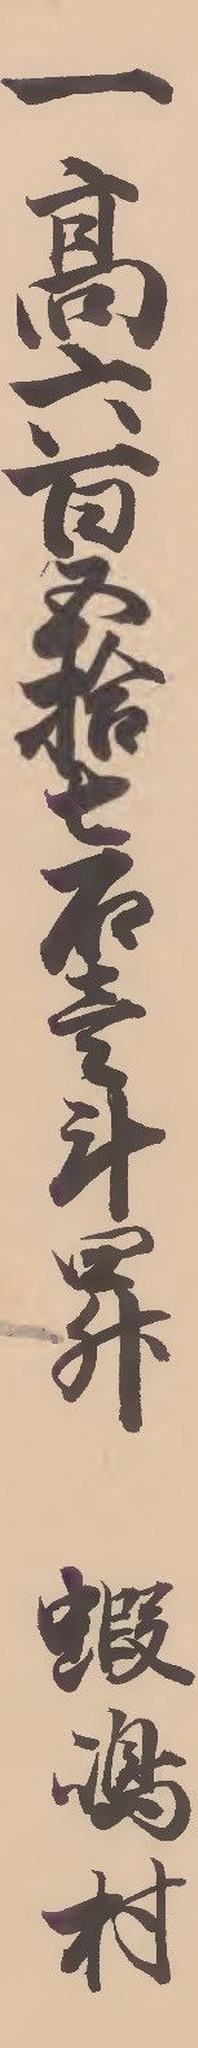一高六百五拾七石壱斗四升蝦島村

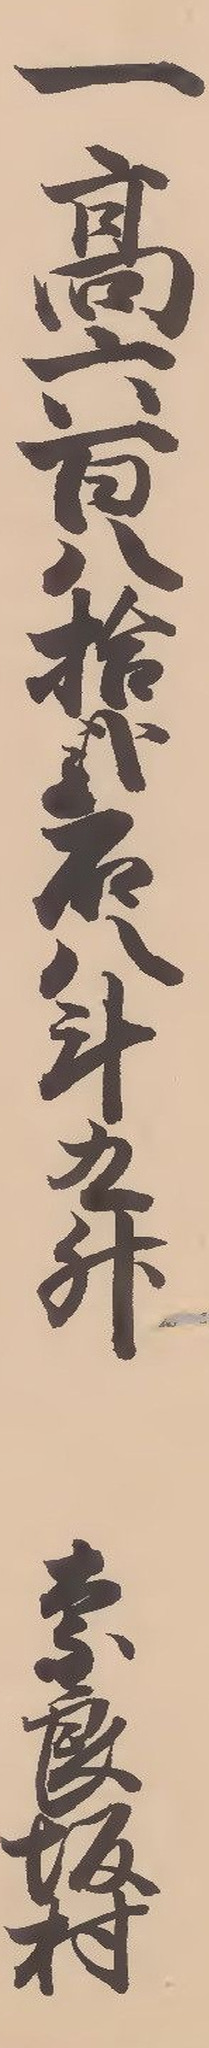一高六百八拾弐石八斗九升奈良坂村
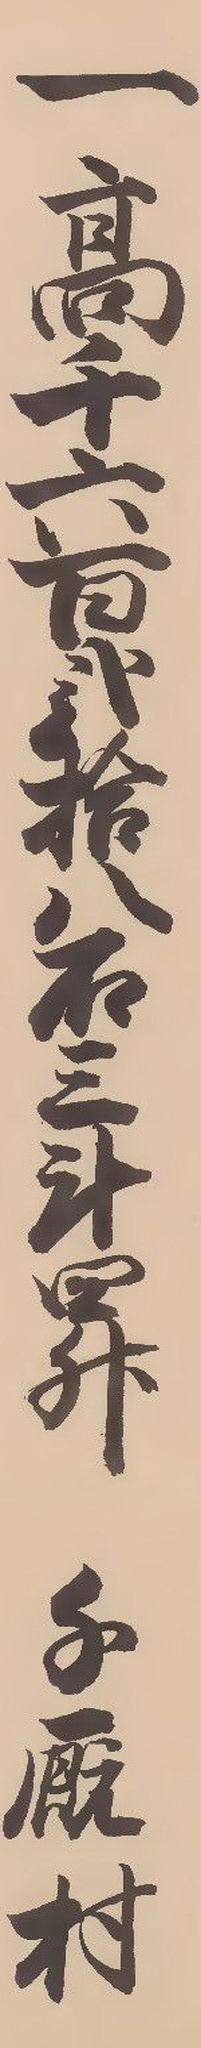一高千六百弐拾八石三斗四升千厩村
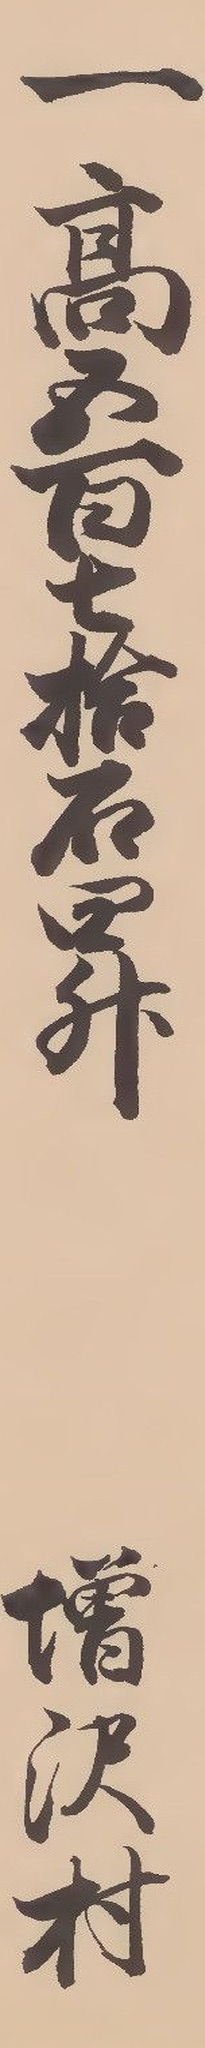一高五百七拾石四升増沢村
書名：陸奥国郷帳　５
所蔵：国立公文書館 National Archives of Japan
